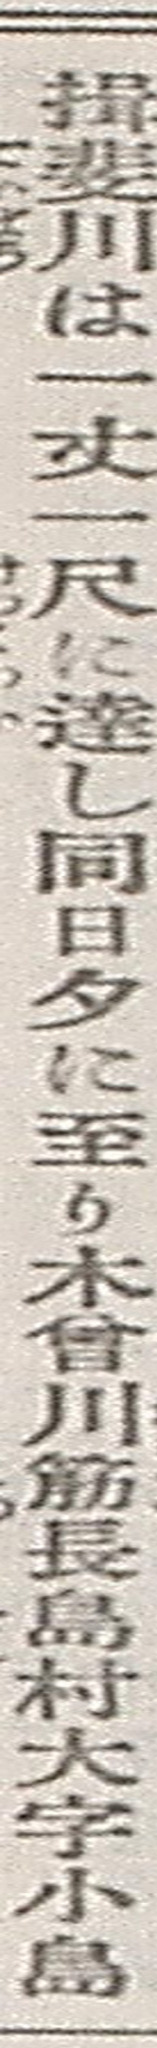揖斐川は一丈一尺に達し同日夕に至り木曽川筋長島村大字小島
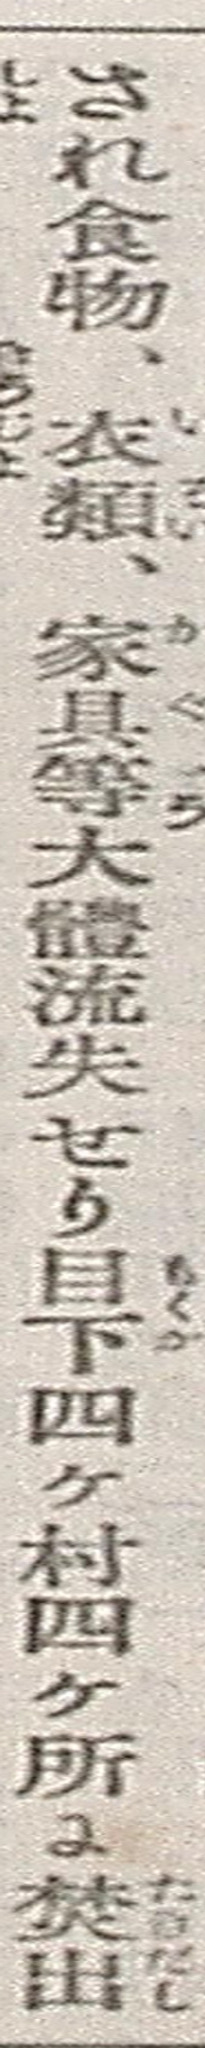され食物、衣類、家具等大体流失せり目下四ヶ村四ヶ所に炊出
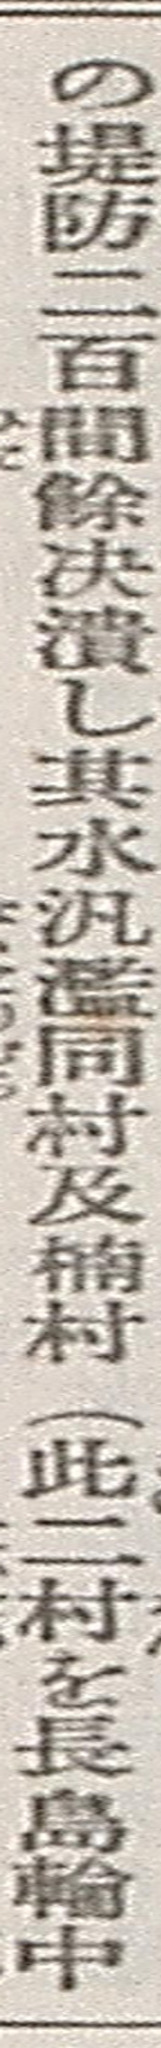の堤防二百間餘决潰し其水汎濫同村及楠村二村を長島輪中
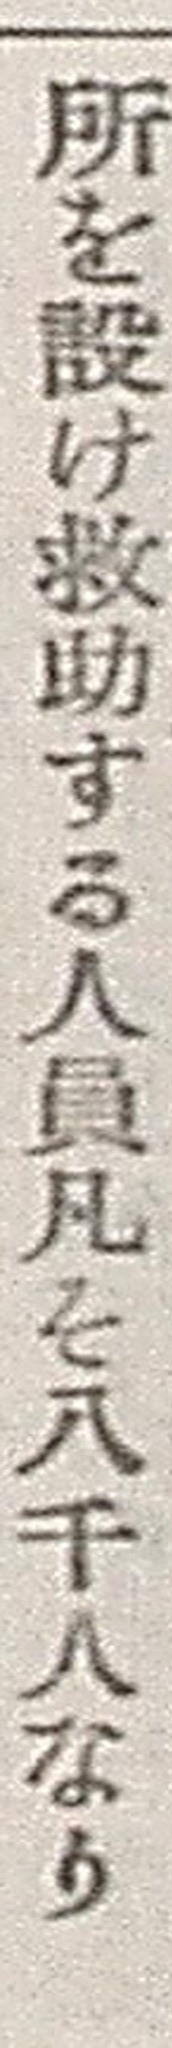所を設け救助する人員凡そ八千人なり
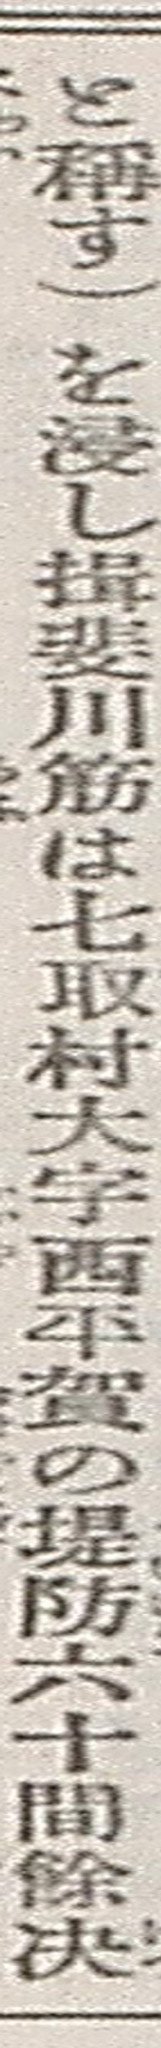と称す）を浸し揖斐川筋は七取村大字西平賀の堤防六十間餘决
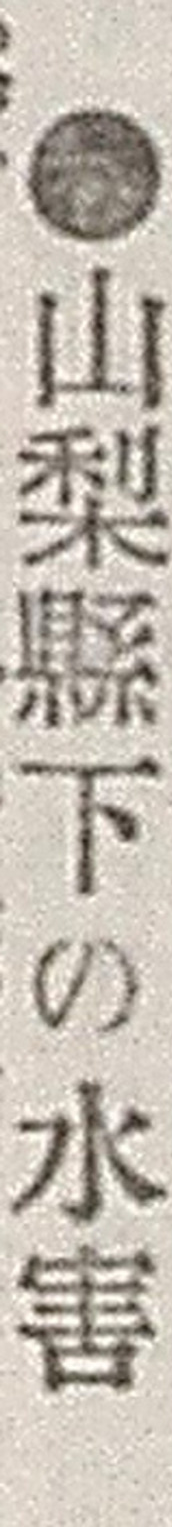●山梨県下の水害
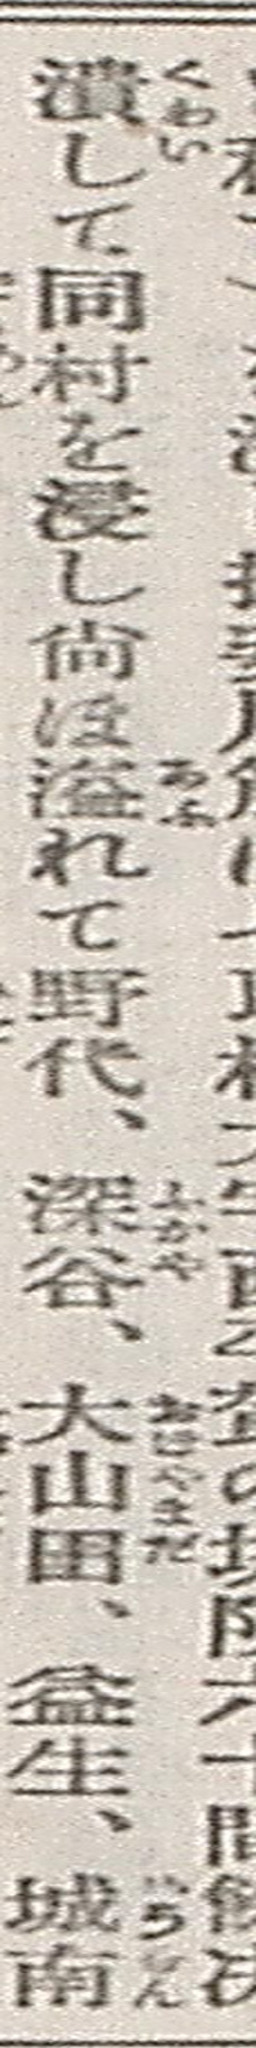潰して同村を浸し尚ほ溢れて野代、深谷、大山田、盆生、城南
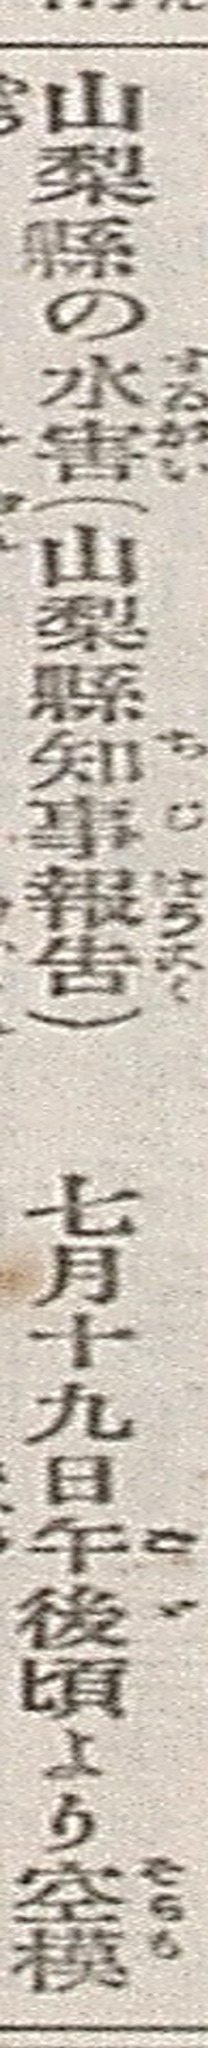山梨県の水害）七月十九日午後頃より空模
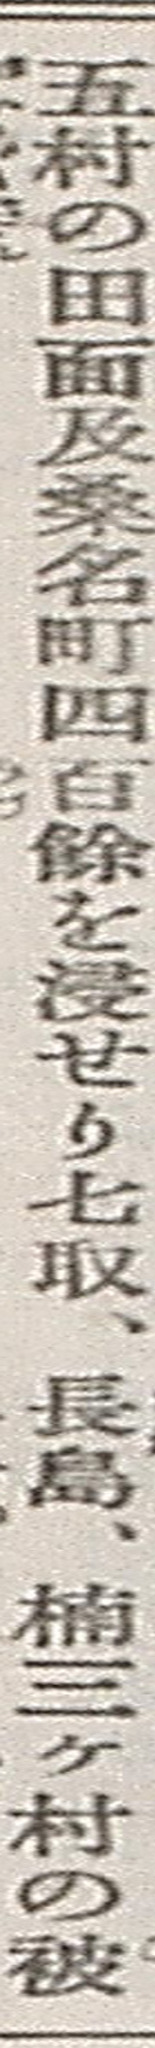五村の田面及桑名町四百餘を浸せり七取、長島、楠三ヶ村の被
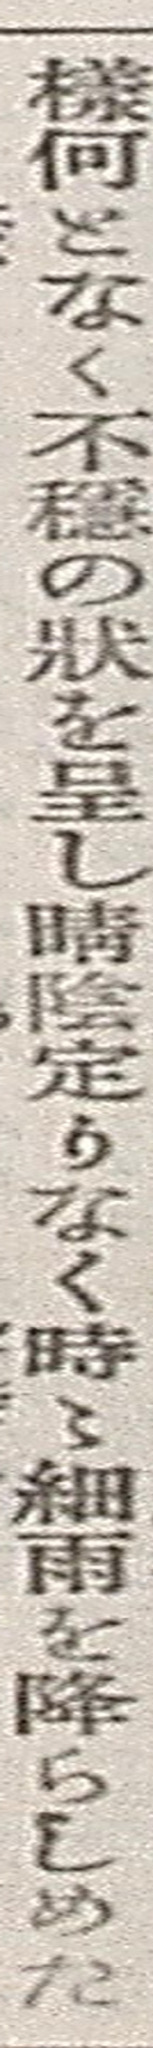様何となく不穏の状を呈し晴陰定りなく時々細雨を降らしめた
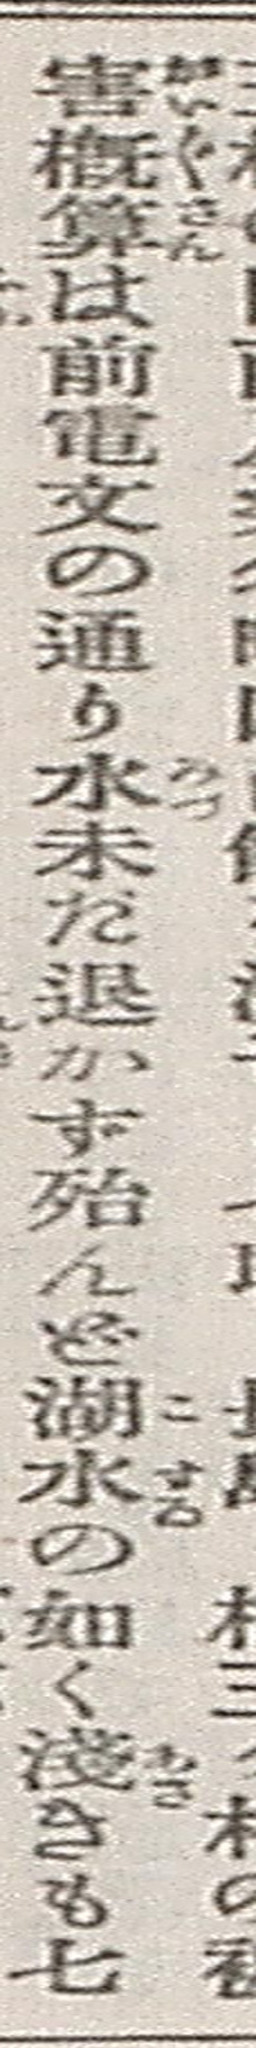害概算は前電文の通り水未だ退かず殆んど湖水の如く浅きも七
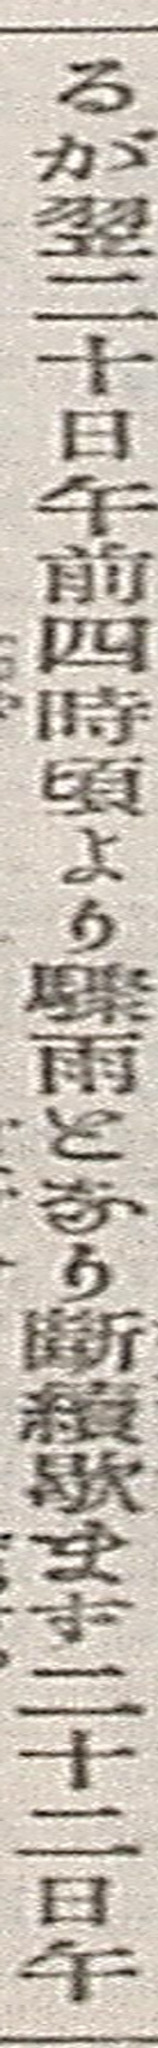るが翌二十日午前四時頃より驟雨となり断続歇まず二十二日午
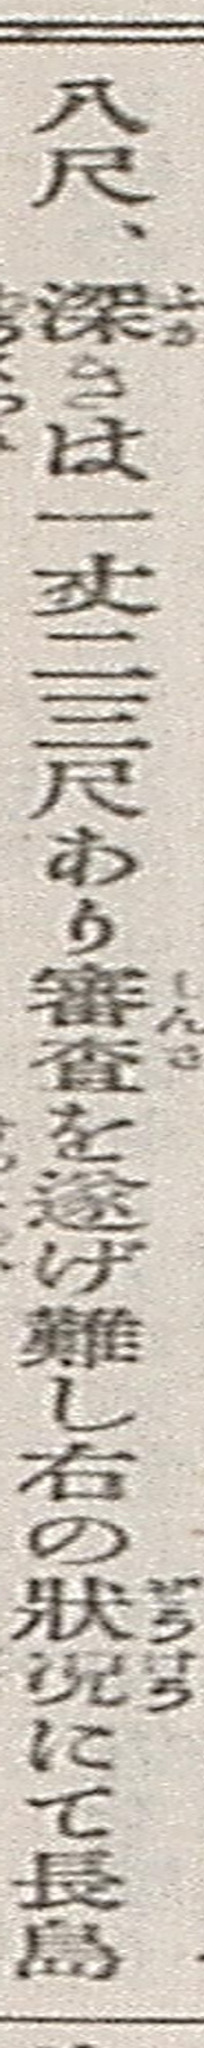八尺、深きは一丈二三尺あり審査を遂げ難し右の状況にて長島
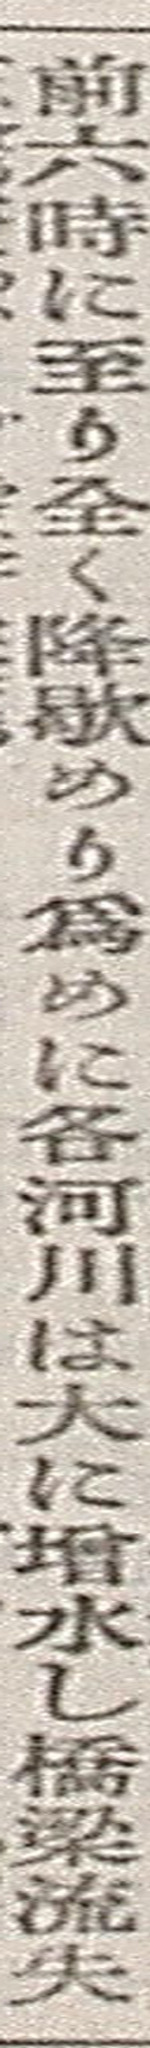前六時に至り全く降歇めり為めに各河川は大に増水し橋梁流失
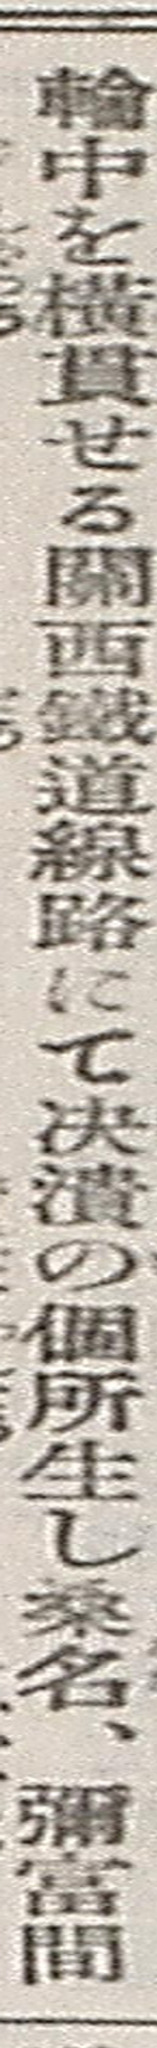輪中を横貫せる関西鉄道線路にて决潰の箇所生じ桑名、弥富間
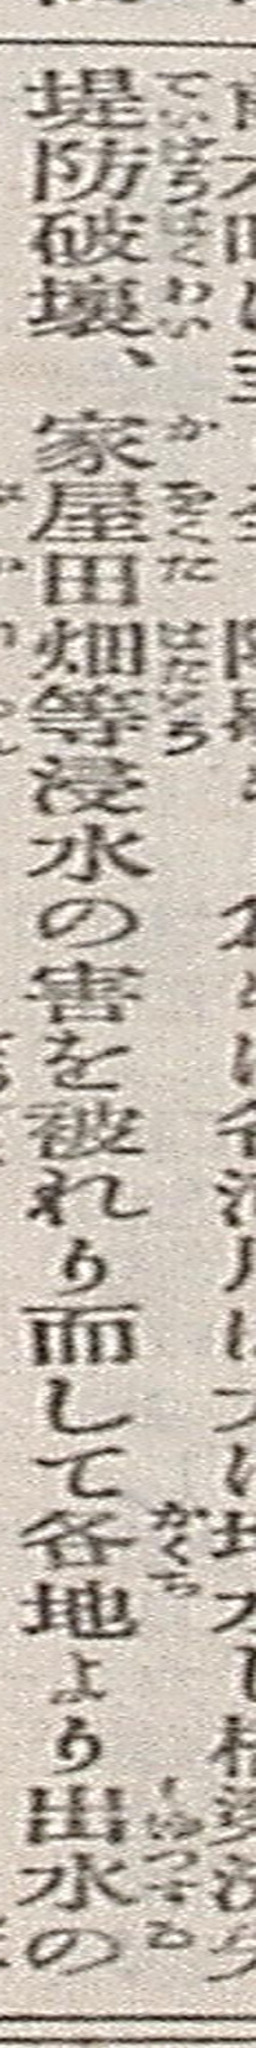堤防破壊、家屋田畑等浸水の害を被れり而して各地より出水の
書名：風俗畫報臨時増刊第百二十八號　洪水被害録（下）
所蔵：東京大学地震研究所図書室 Earthquake Research Institute Library, The University of Tokyo, JAPAN
